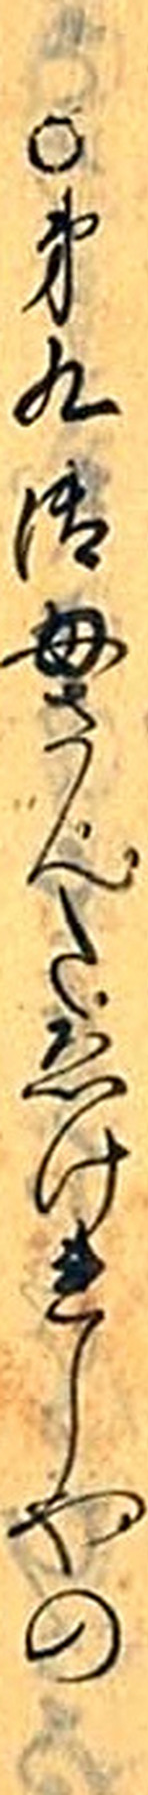○第九御母さんたゑけれしやの
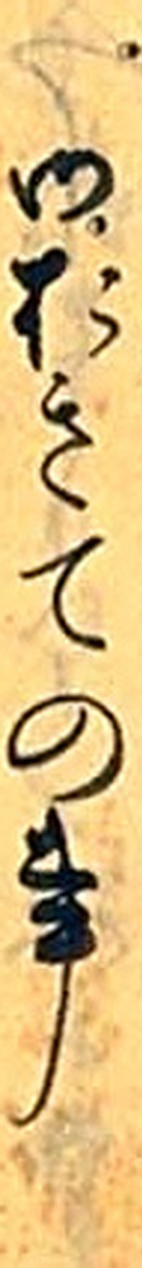御おきての事
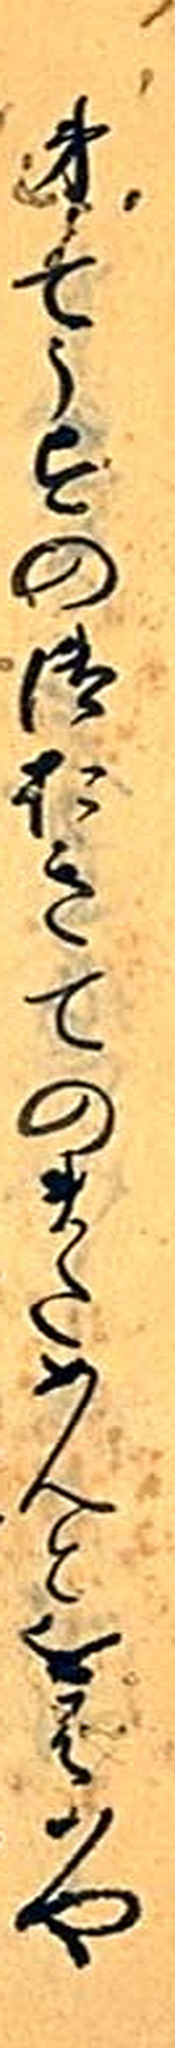弟てうすの御おきてのまためんとをははや
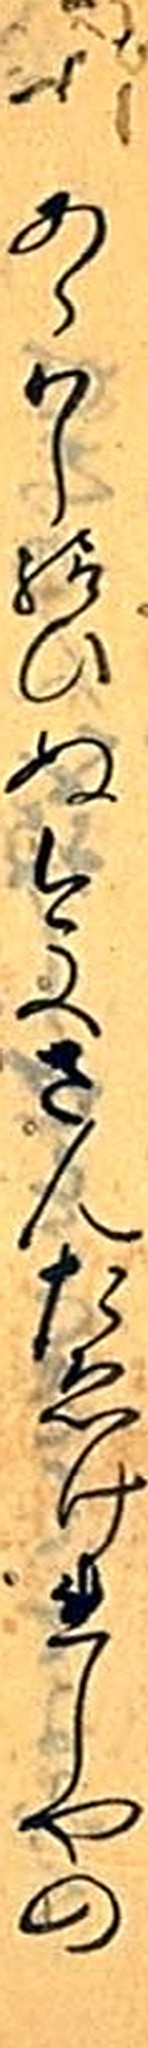あらはし給ひぬ今又さんたゑけれしやの
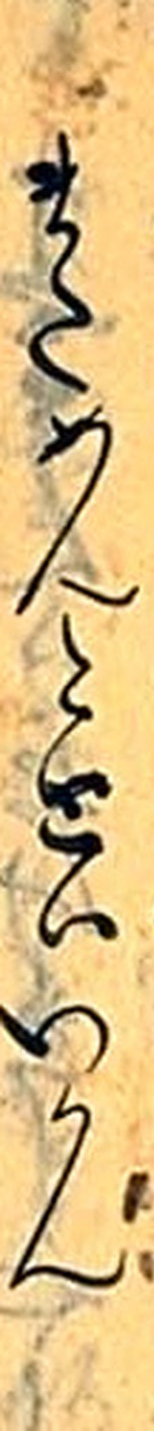まためんととはいかん
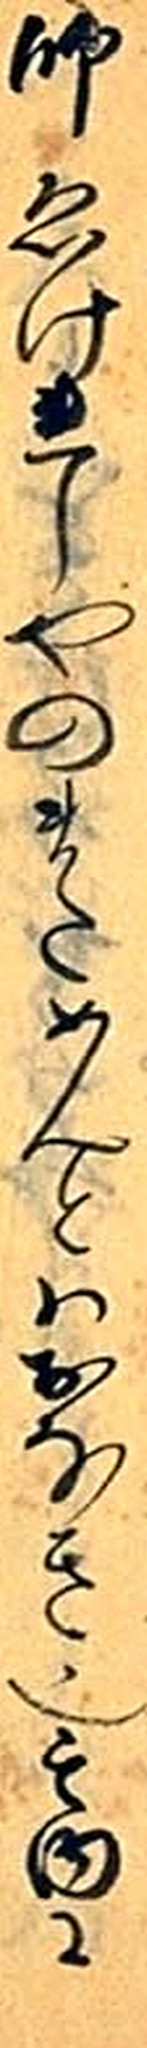師ゑけれしやのまためんとはおほき也其内に
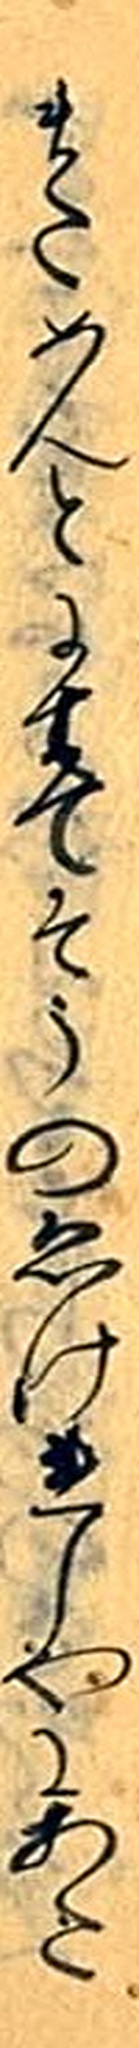まためんとにてそうのゑけれしやにあた
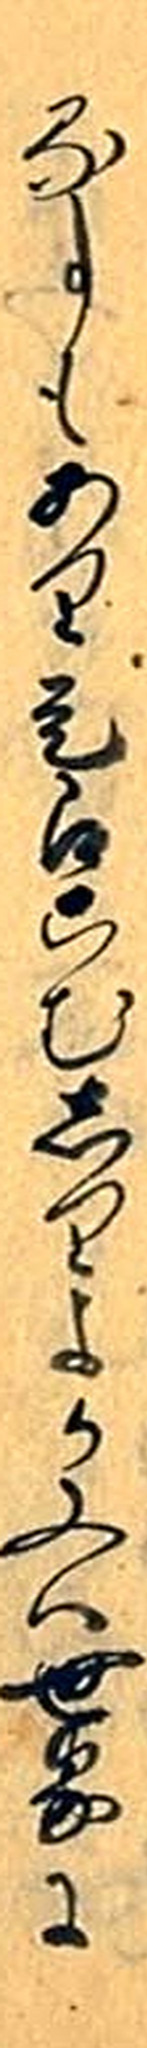る事もあり是即こむしりよか又は世界に
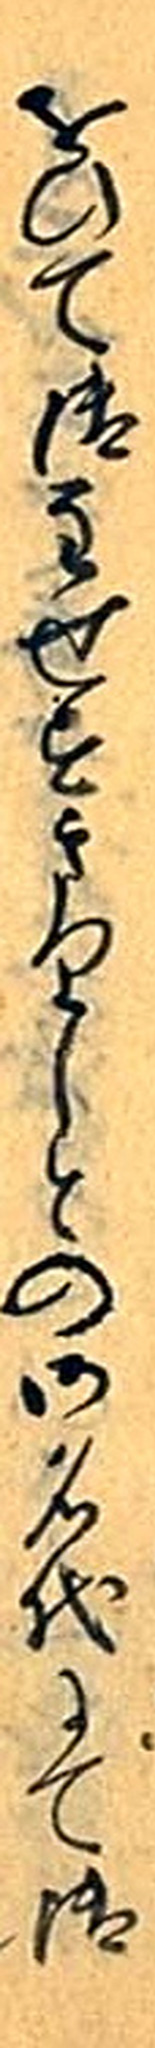をひて御主せすきりしとの御名代にて御
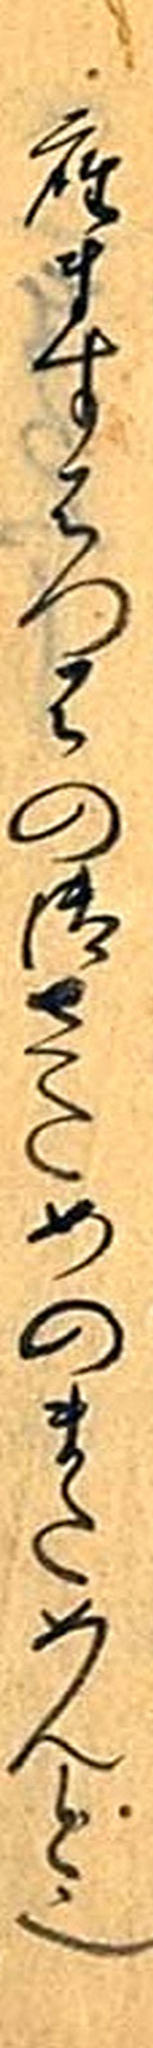座ますはつはの御さためのまためんと也
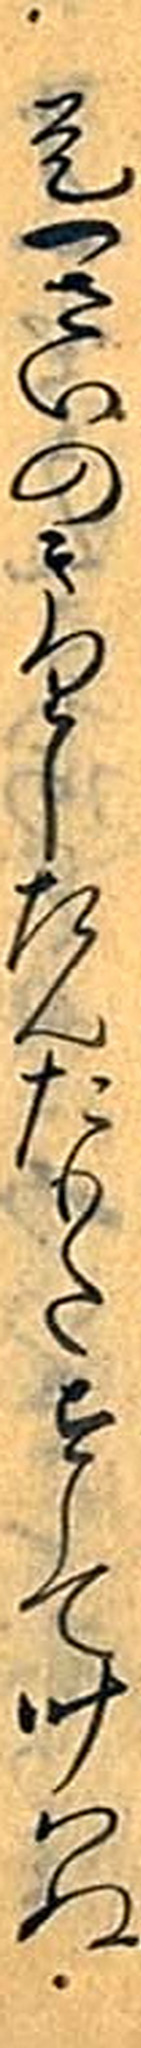是一さいのきりしたんたもたすして叶はぬ
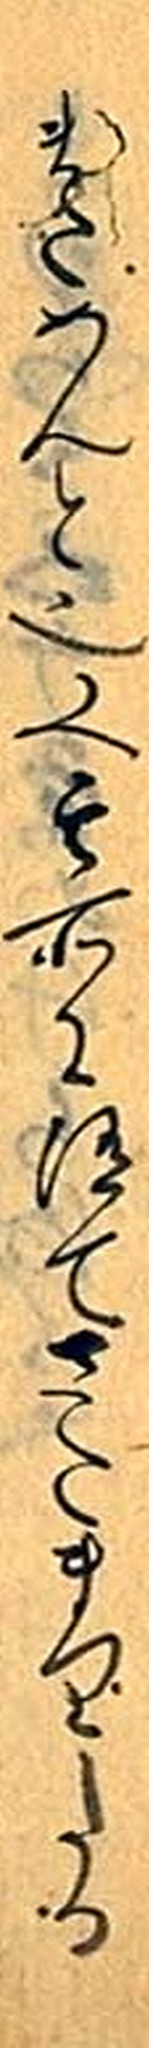まためんと也又其所に随てさたまりたる
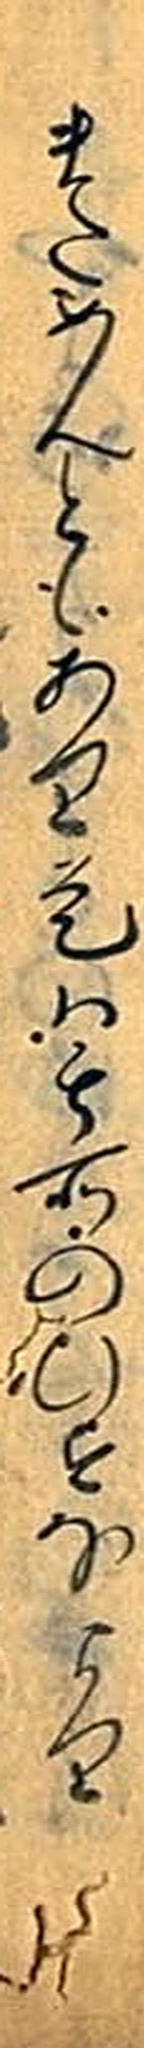まためんともあり是は其所のひすほより
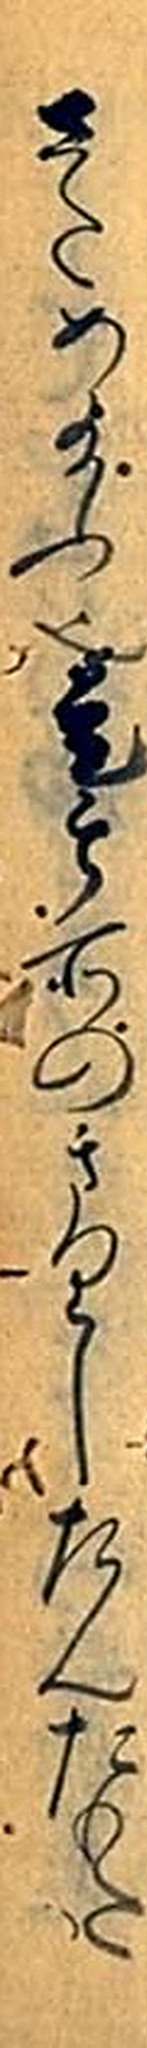さため給ふ也是其所のきりしたんたもた

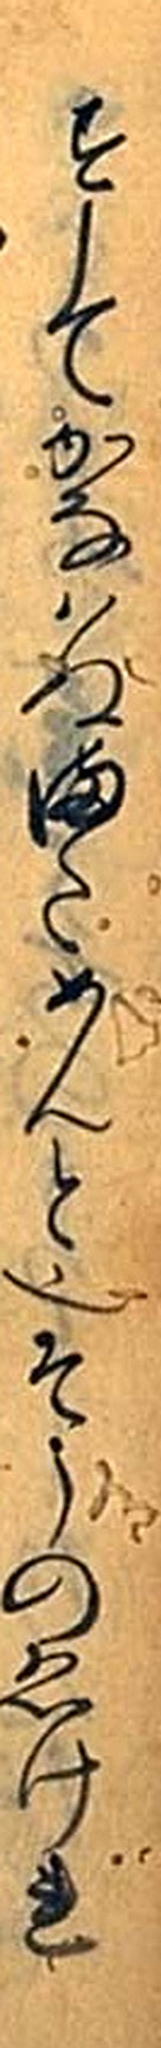をしてかなはぬまためんと也そうのゑけれ
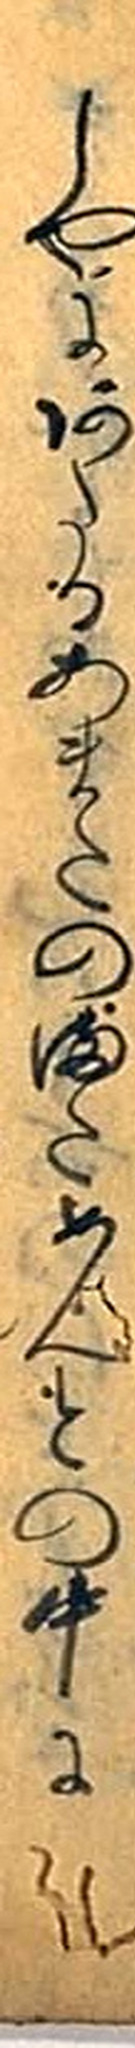しやにあたるあまたのまためんとの中に
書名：ドチリナ・キリシタン
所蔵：東京大学総合図書館 / General Library in the University of Tokyo
